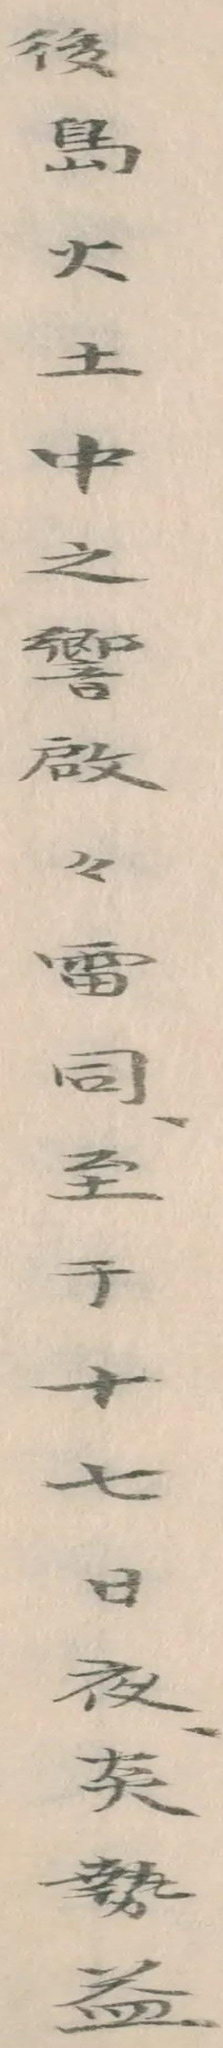後島火土中之響啓々雷同、至于十七日夜、炎勢益

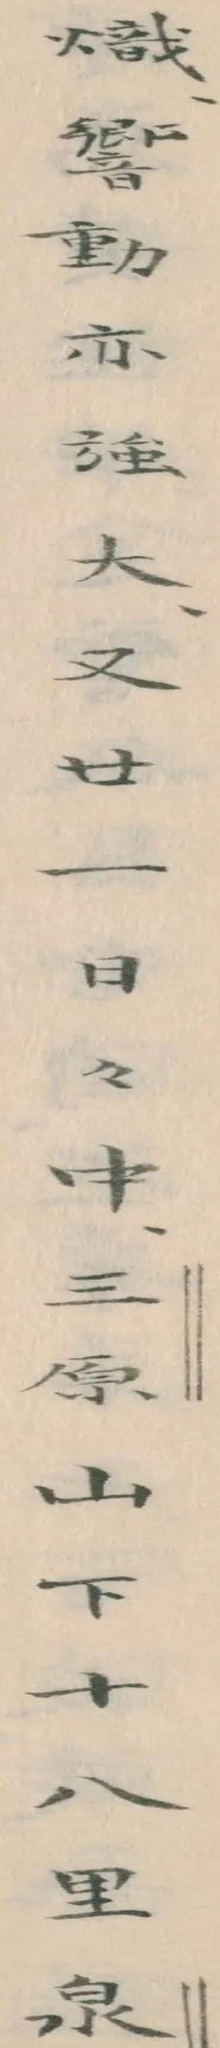熾、響動亦強大、又廿一日々中、三原山下十八里泉
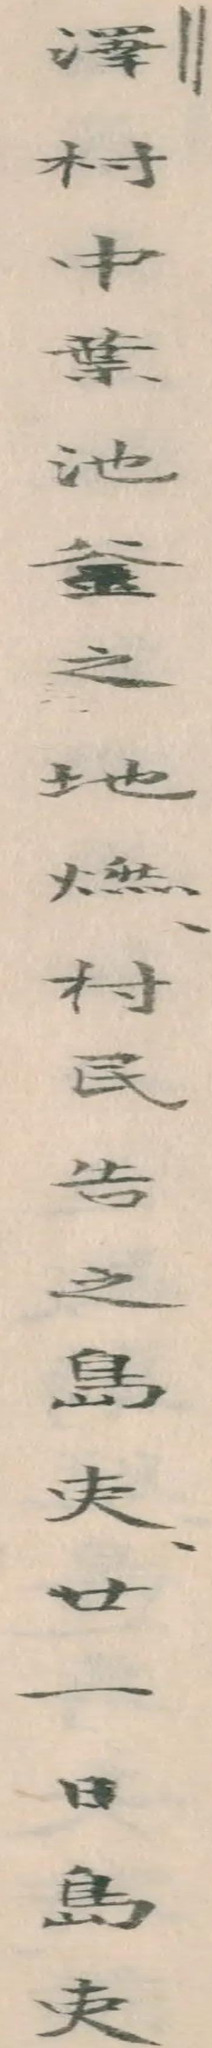沢村中葉池釜之池燃、村民告之島吏、廿一日島吏
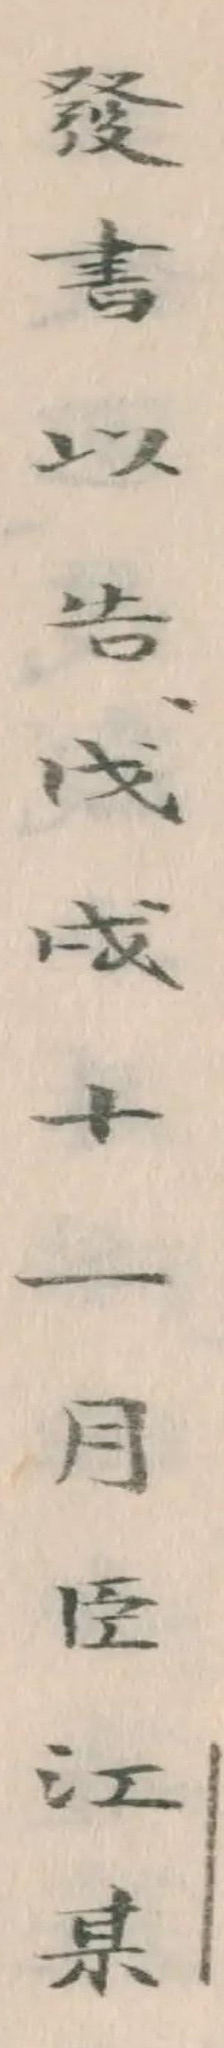発書以告、戊戌十一月臣江某
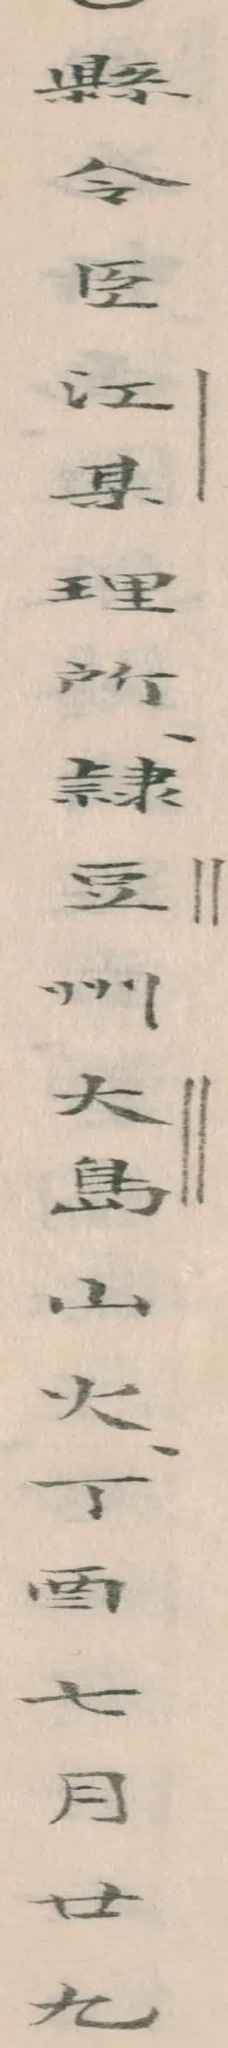○県令臣江某理所、隷豆州大島山火、丁酉七月廿九
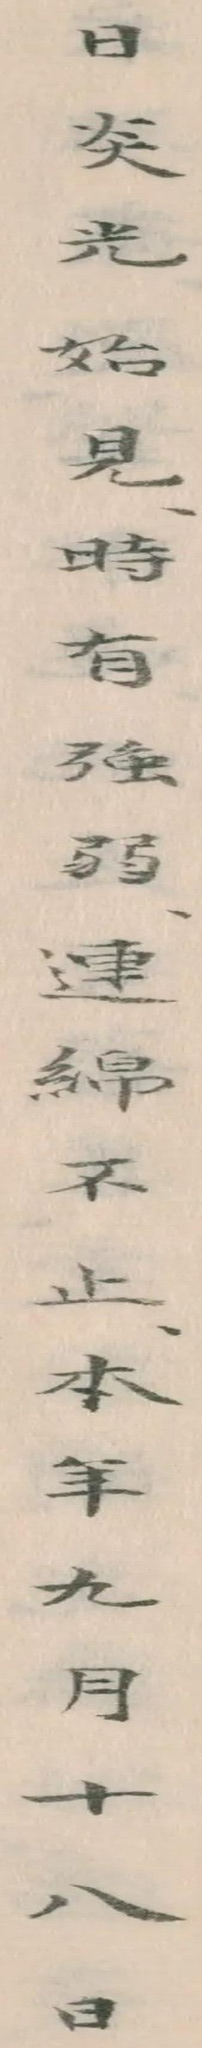日炎光始見、時有強弱、連綿不止、本年九月十八日
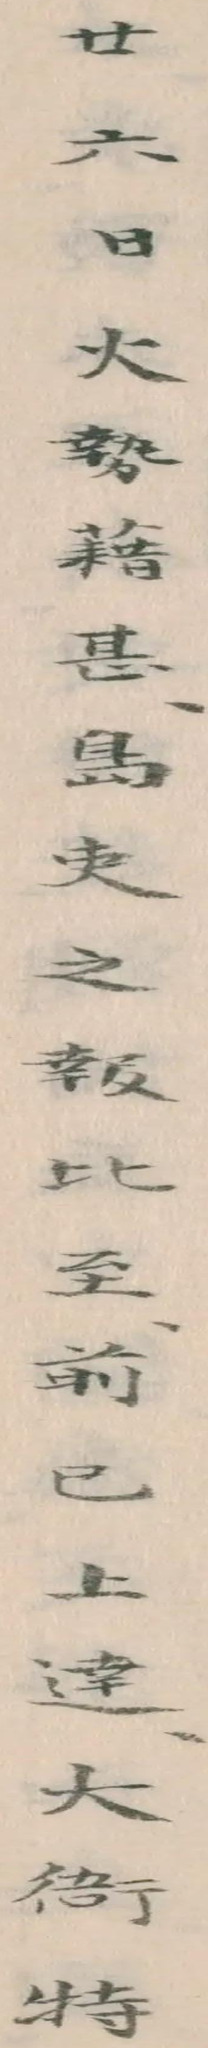廿六日火勢藉甚、島吏之報比至、前已上達、大衙特
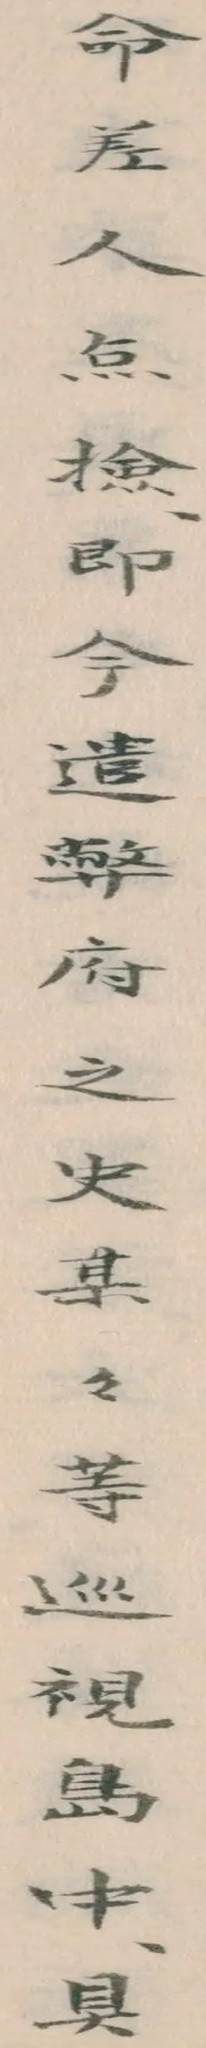命差人点検、即今遣幣府之史某々等巡視島中、具
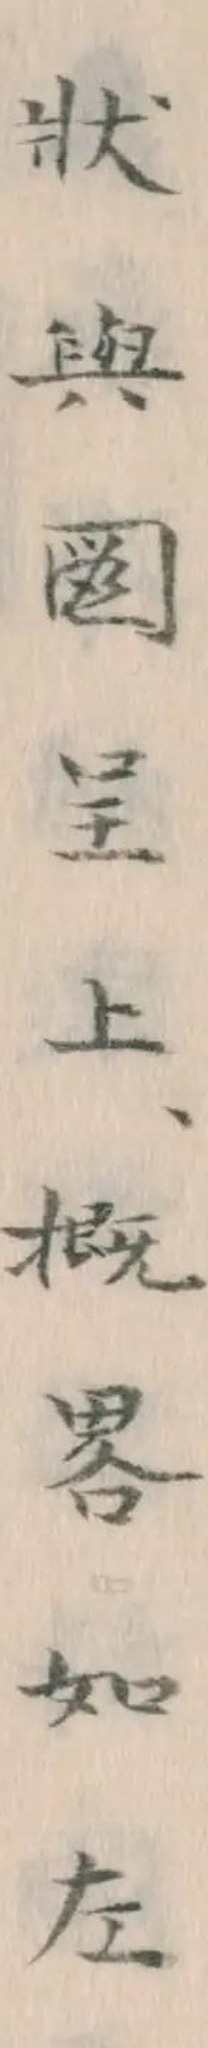状与図呈上、概略如左
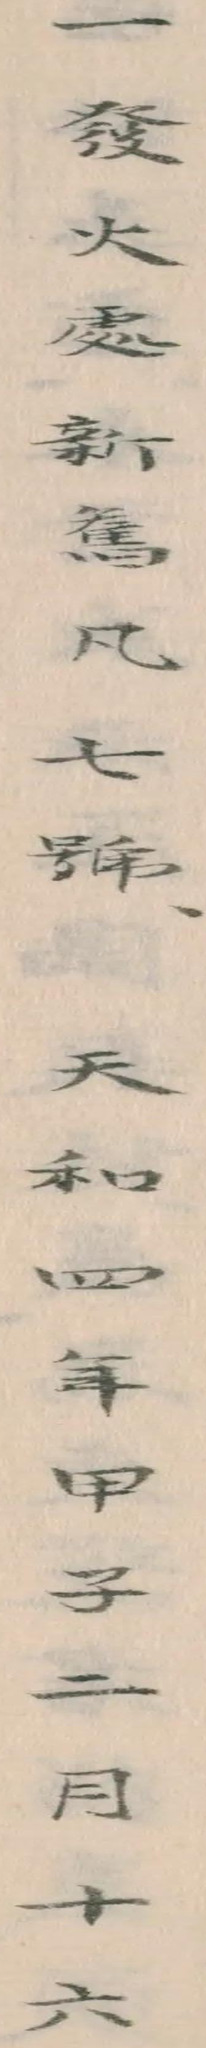一発火処新旧凡七号、天和四年甲子二月十六
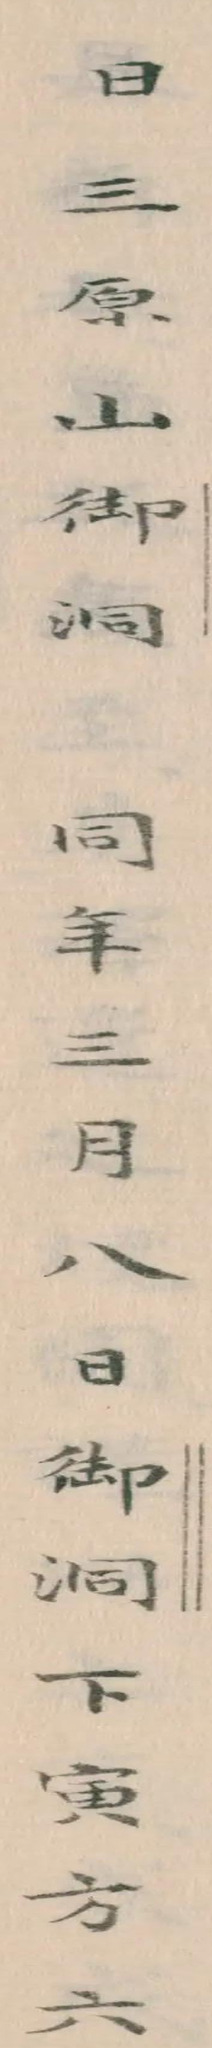日三原山御洞同年三月八日御洞下寅方六
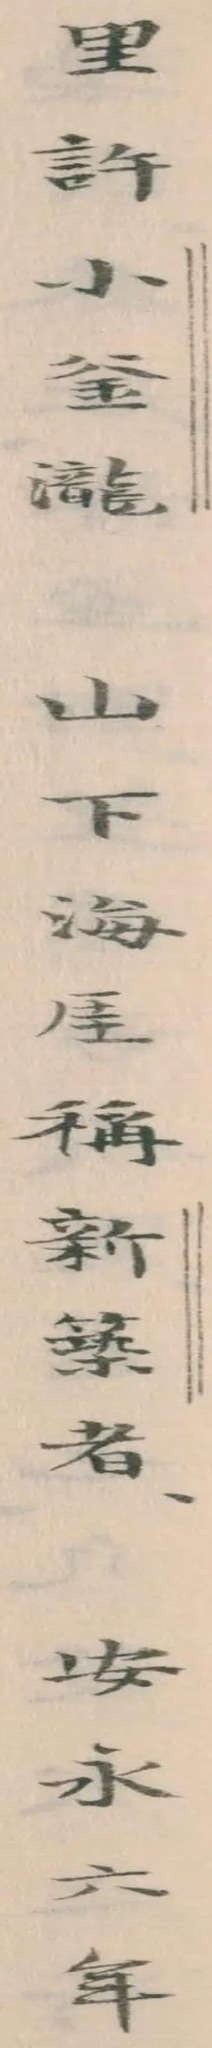里許小釜瀧山下海厓稍新築者、安永六年
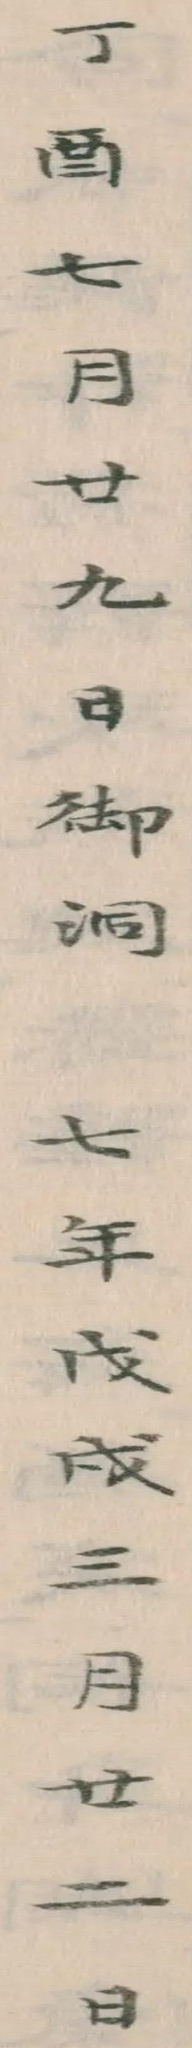丁酉七月廿九日御洞七年戊戌三月廿二日
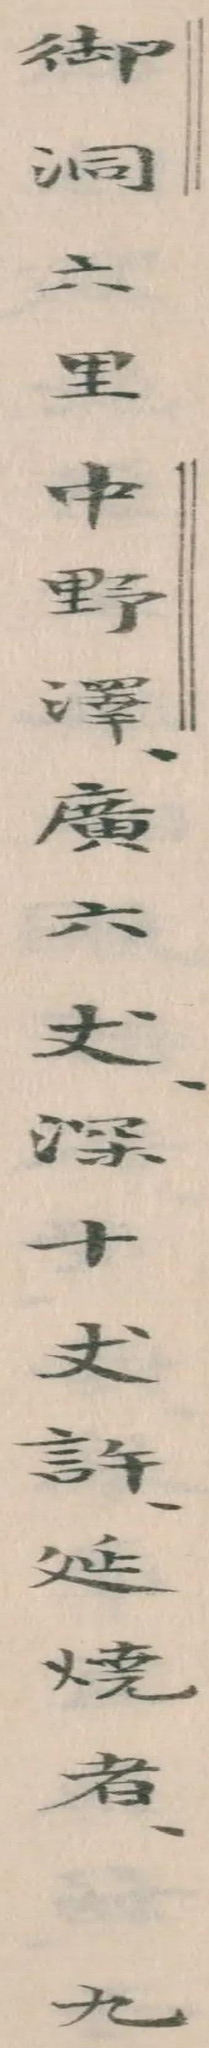御洞六里中野沢、広六丈、深十丈許、延焼者、九
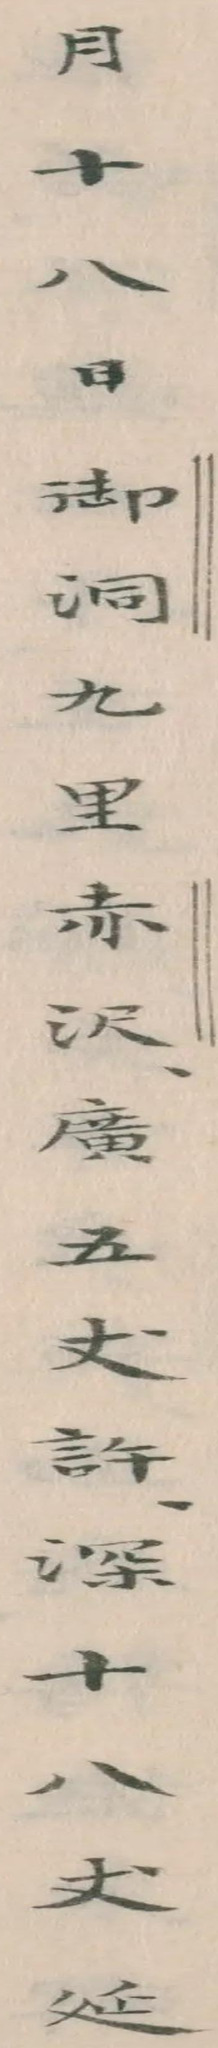月十八日御洞九里赤沢、広五丈許、深十八丈延
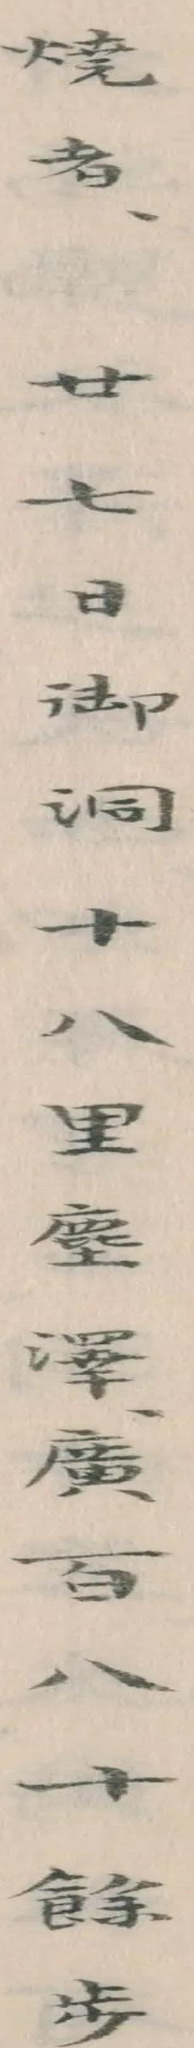焼者、廿七日御洞十八里塵沢、広百八十余歩
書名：地災撮要. 巻11-12(地震之部)
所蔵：国立国会図書館 National Diet Library, JAPAN
